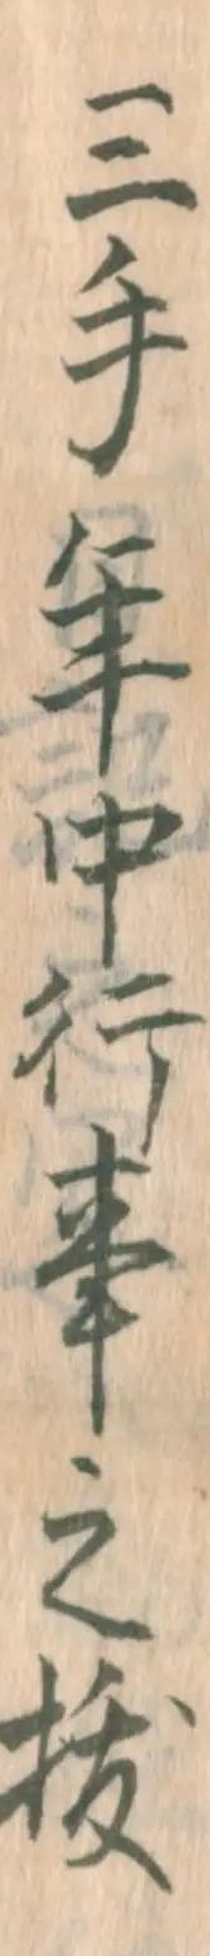三手年中行事之抜
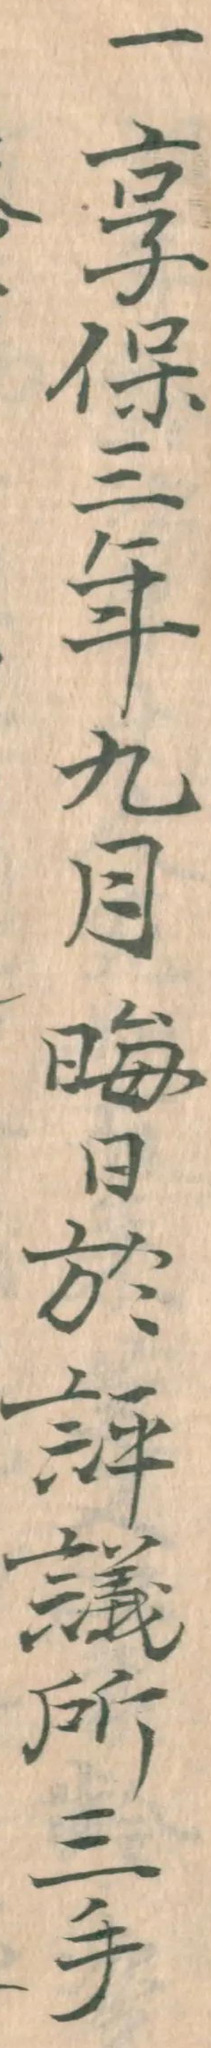一、享保三年九月晦日於評議所三手
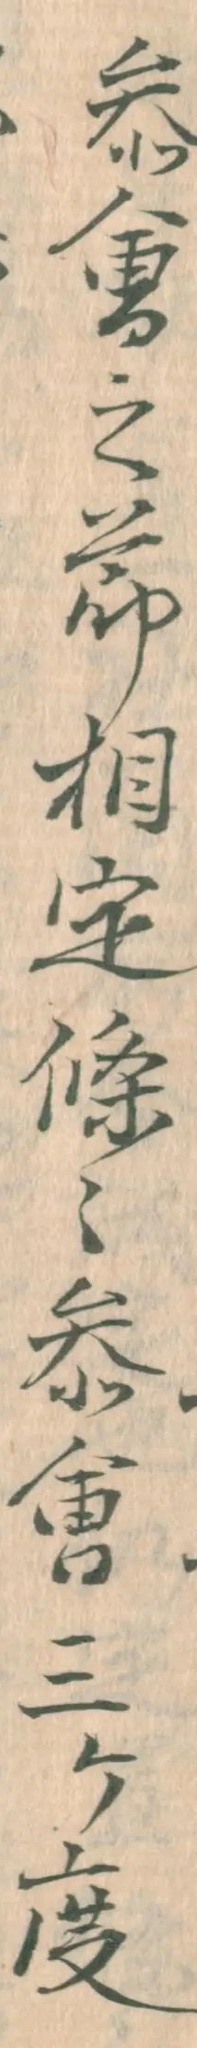参會之節相定條々参會三ヶ度
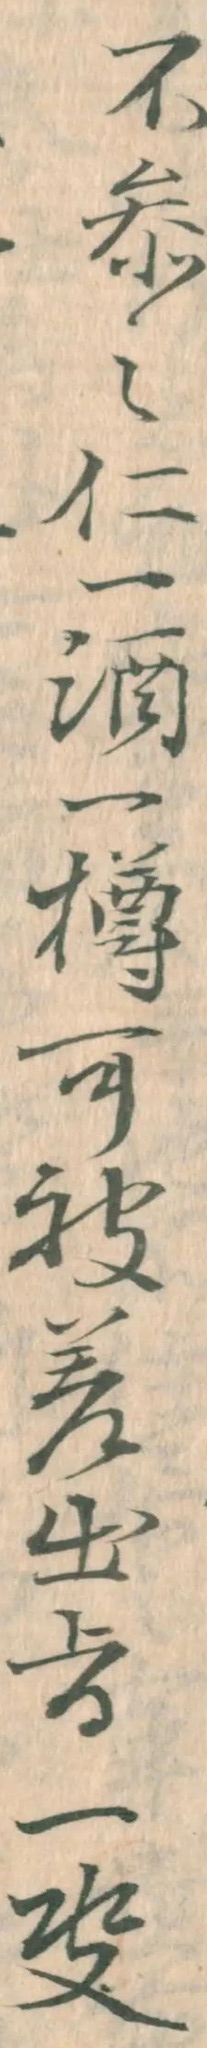不参之仁一酒一樽可被差出旨一決
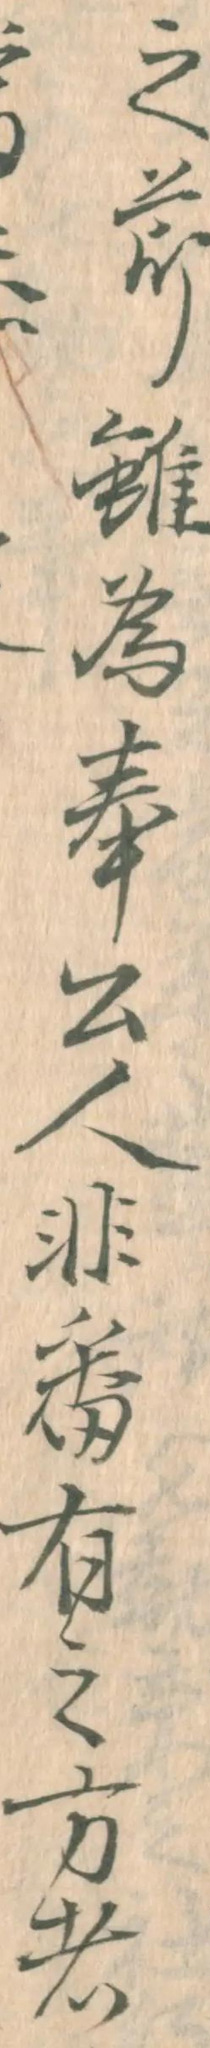之節雖為奉公人非番有之方者
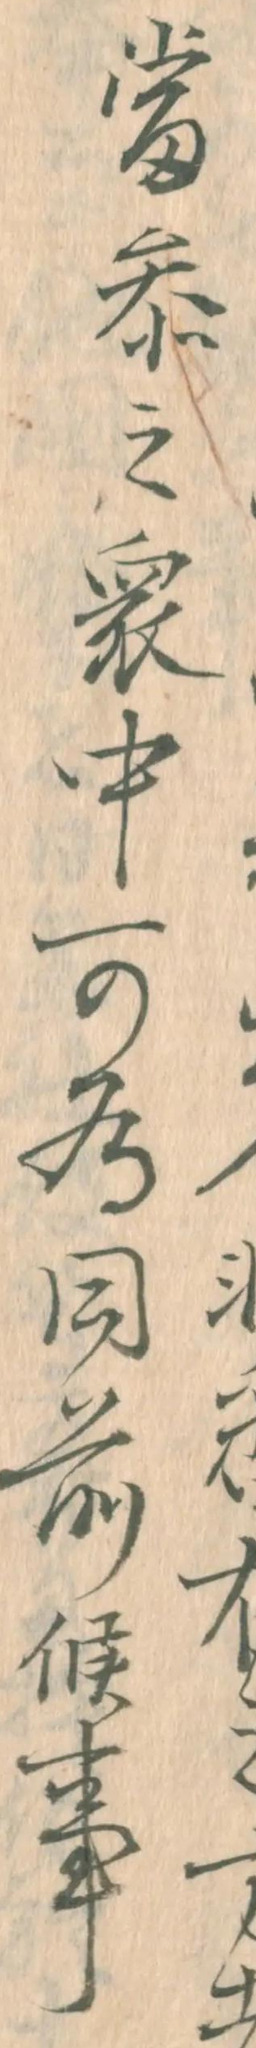當参之衆中可為同前候事

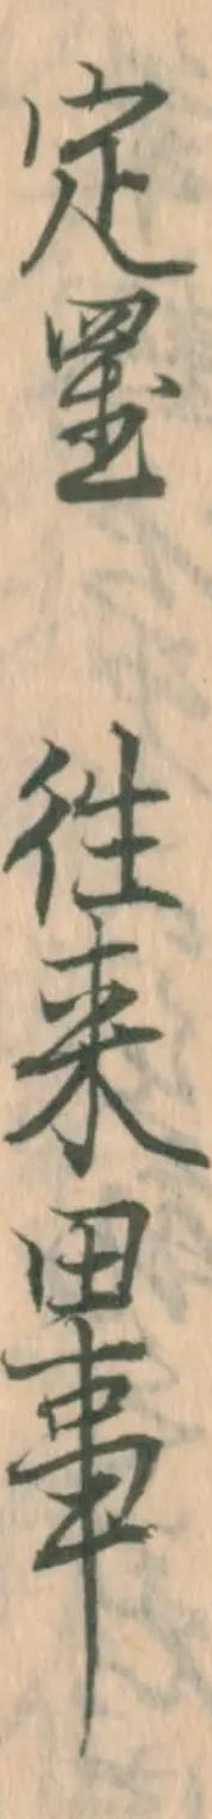定置往来田事
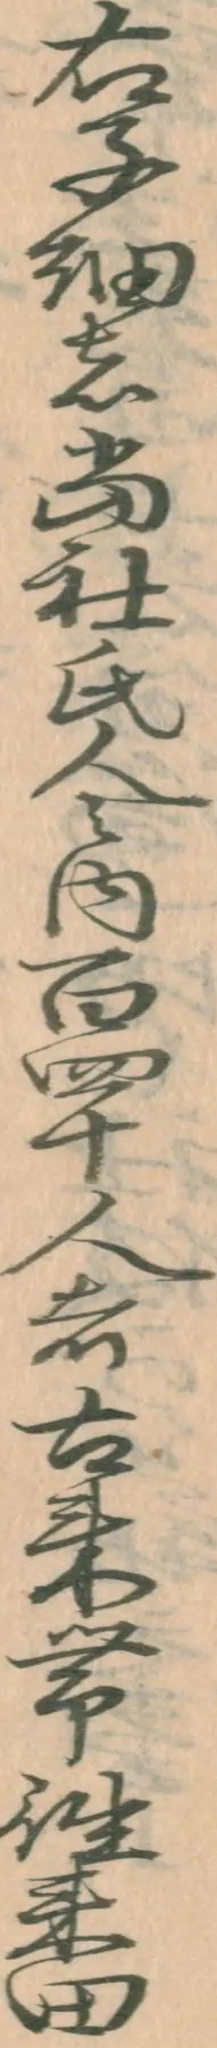右子細者當社氏人之内百四十人者古来常往来田
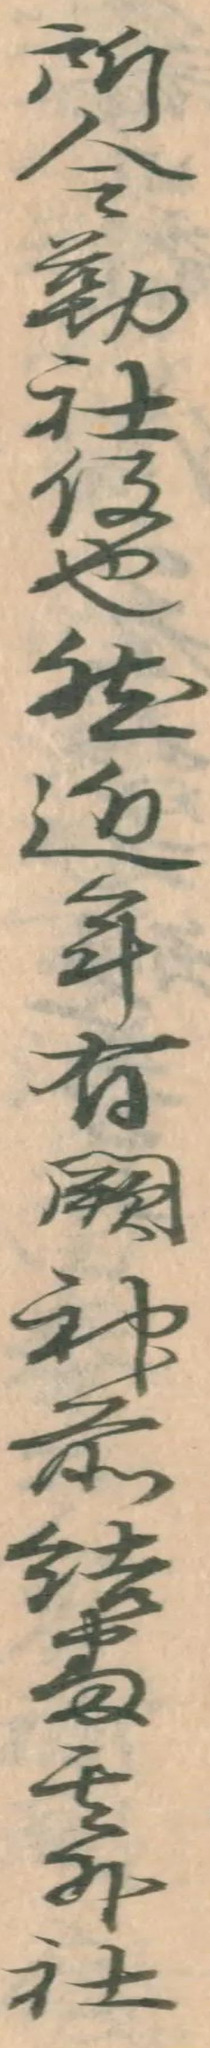所令勤社役也然近年有闕神前結番其外社
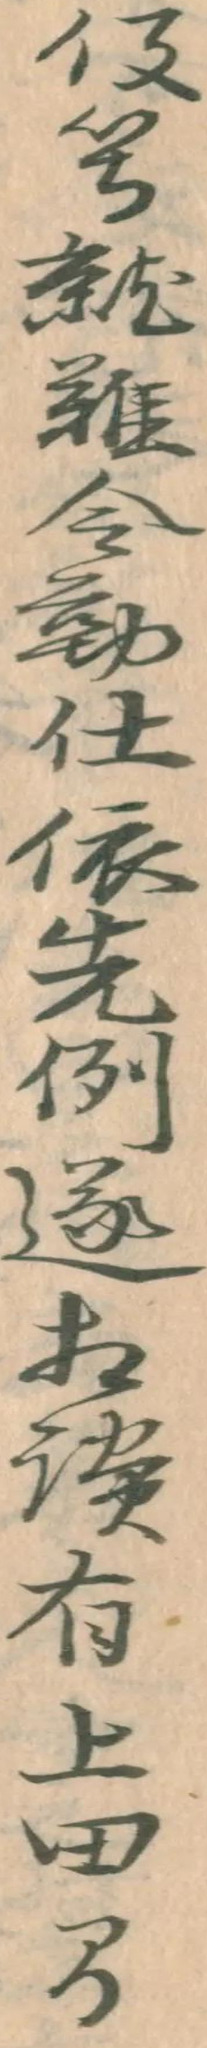役等就難令勤仕依先例遂相談有上田間
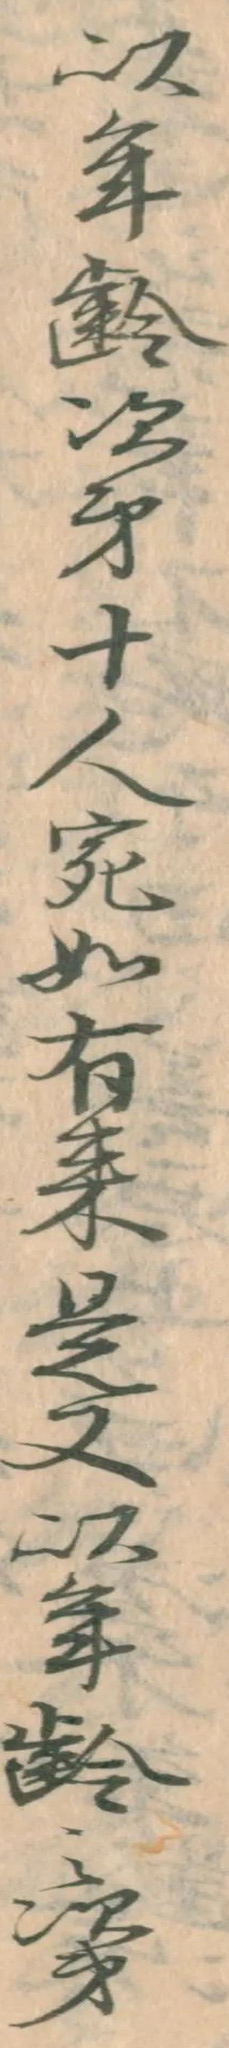以年齢次第十人宛如有来是又以年齡之次第
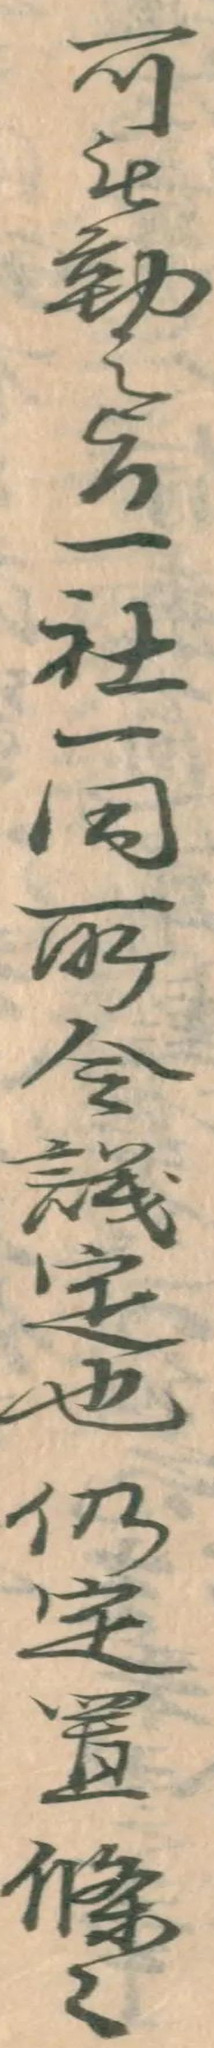可被勤之旨一社一同所令議定也仍定置條々
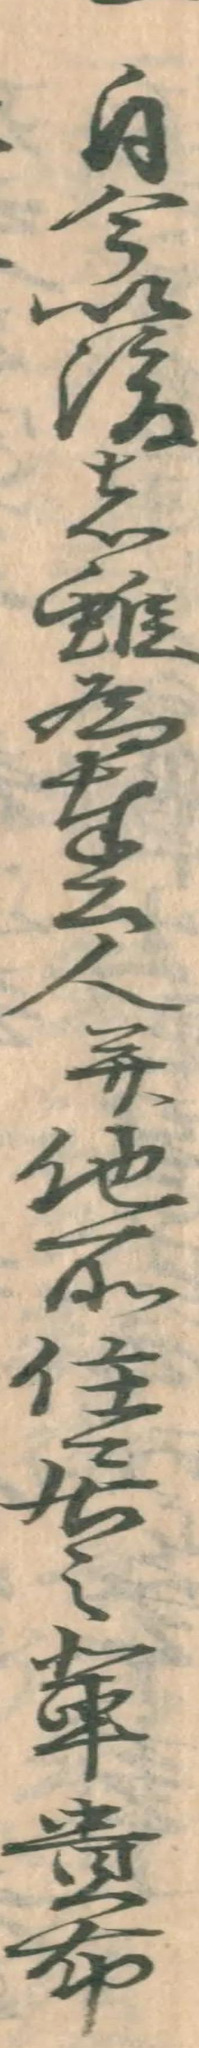一、自今以後者雖為奉公人幷他所住居之輩貴布
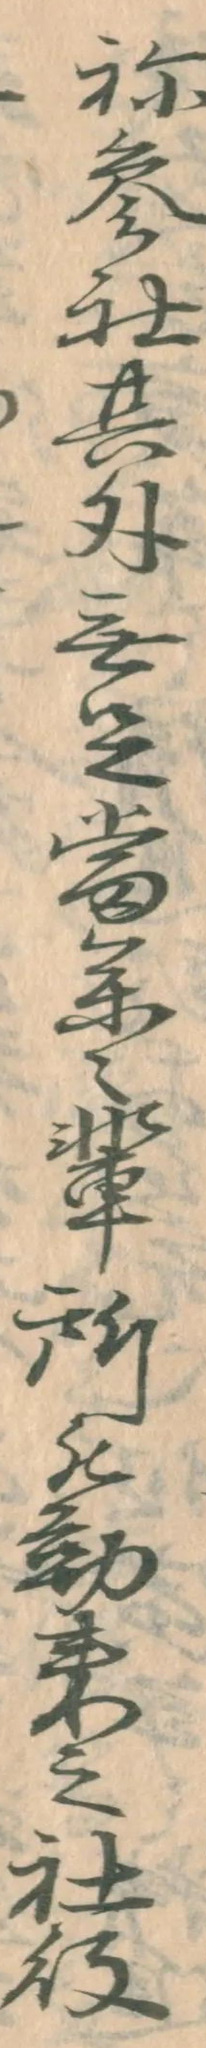称参社其外無足當参之輩所被勤来之社役
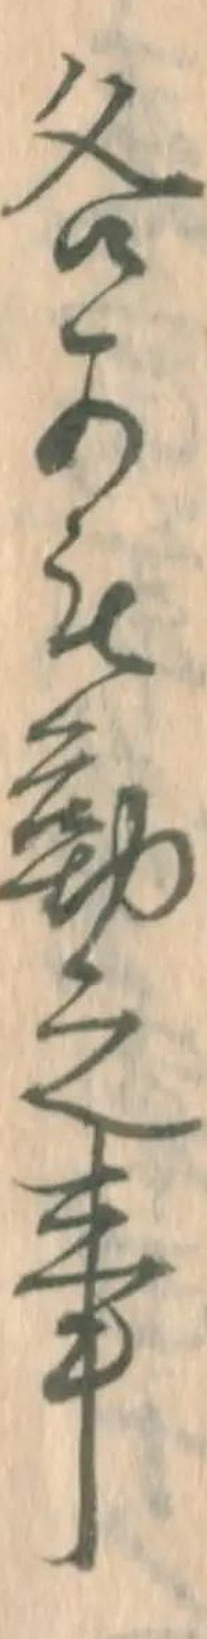各可被勤之事
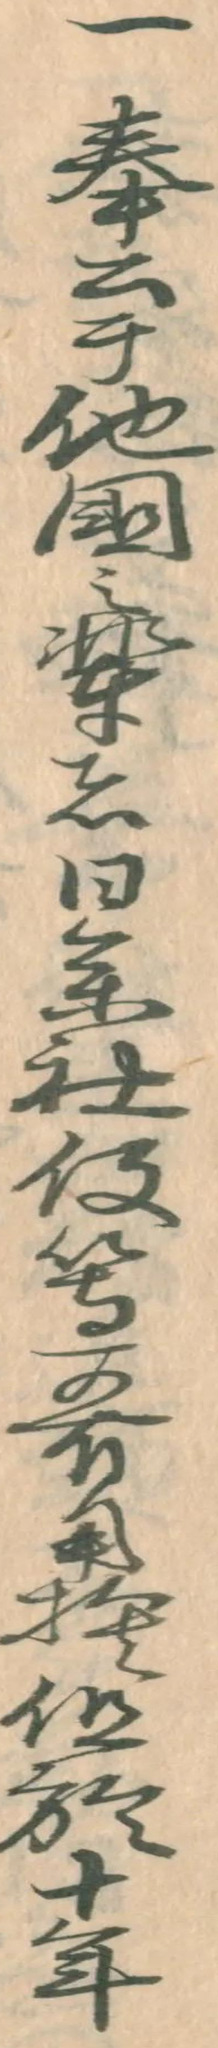一、奉公于他国之輩者日参社役等可有用捨但於十年
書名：賀茂社記録. 第39冊
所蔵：国立国会図書館 National Diet Library, JAPAN
